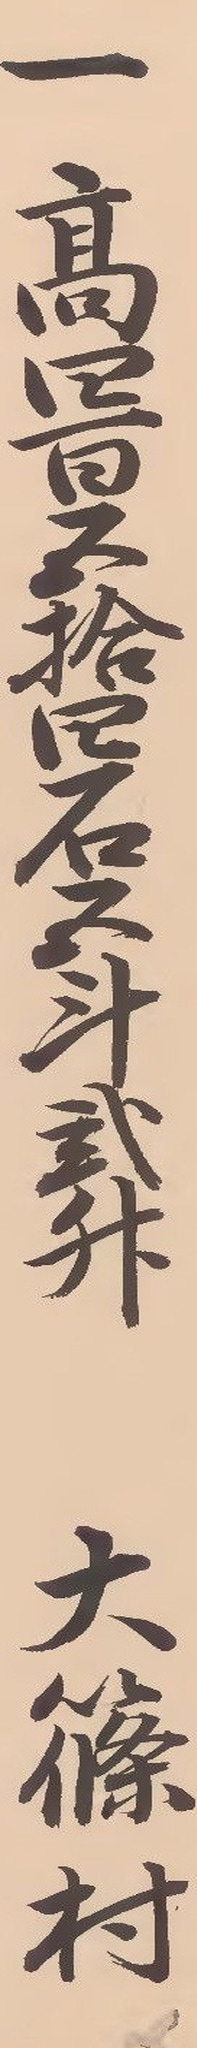一高四百五拾四石五斗弐升大篠村
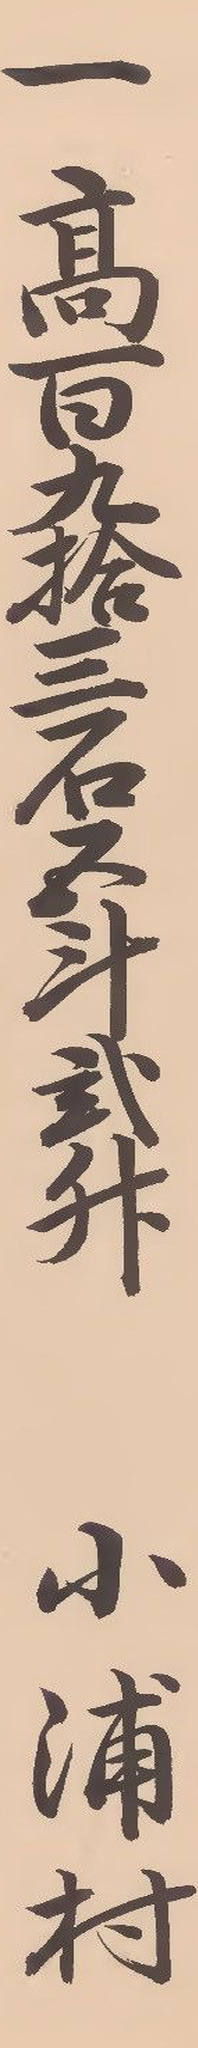一高百九拾三石五斗弐升小浦村
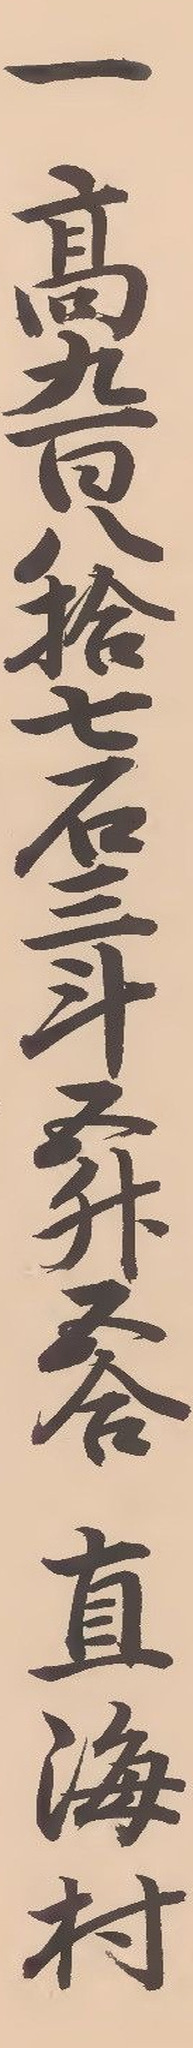一高九百八拾七石三斗五升五合直海村
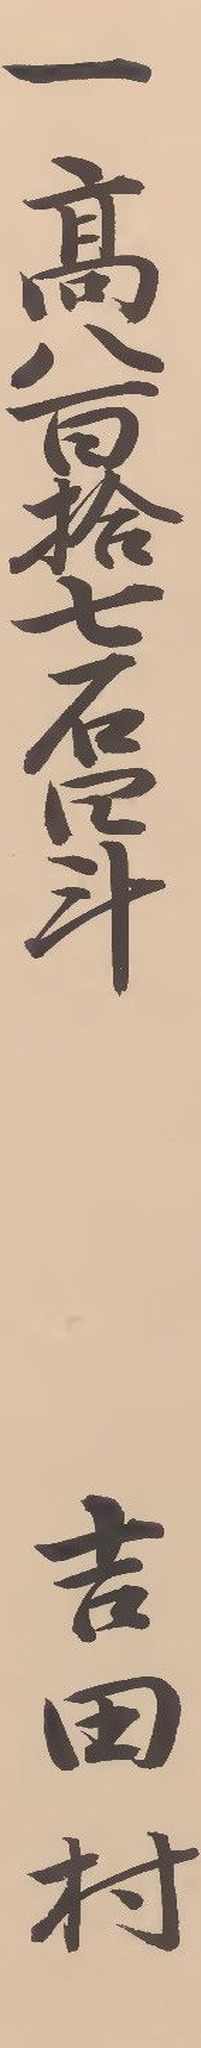一高八百拾七石四斗吉田村
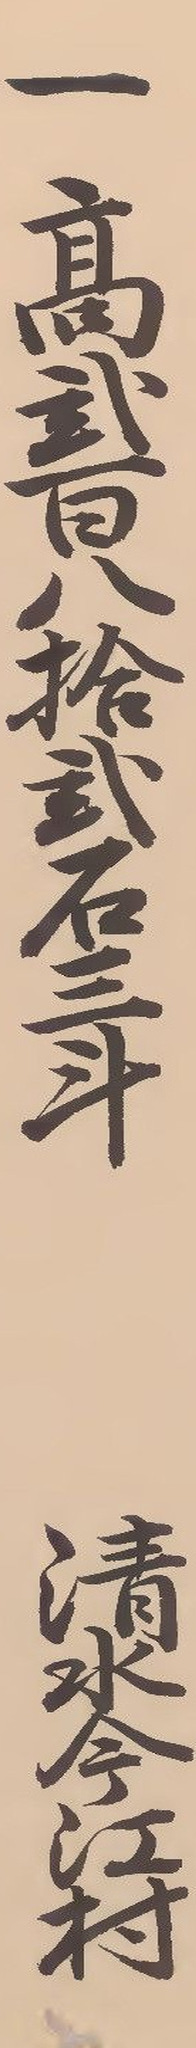一高弐百八拾弐石三斗清水今江村
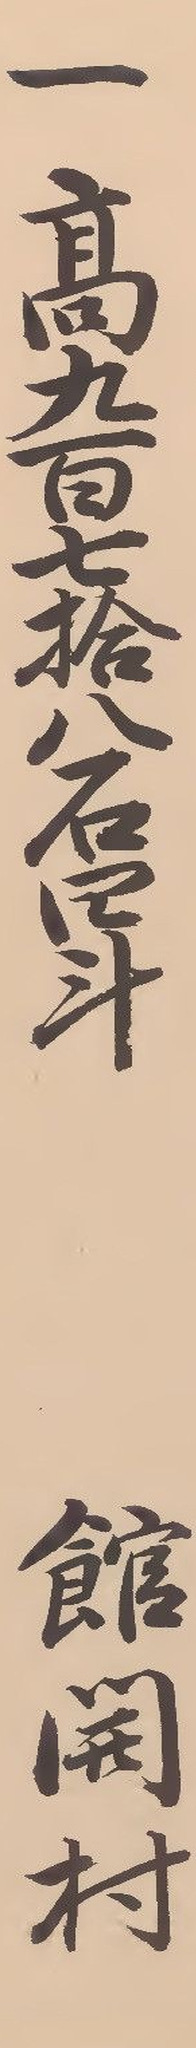一高九百七拾八石四斗館開村

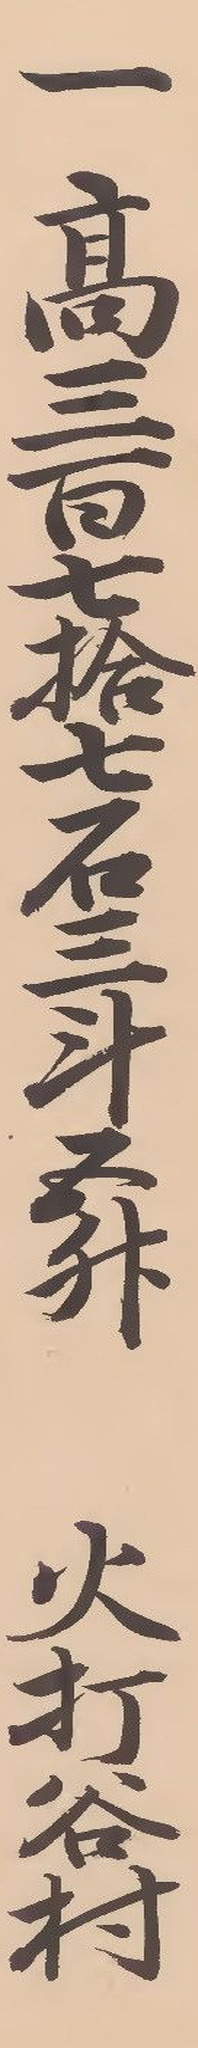一高三百七拾七石三斗五升火打谷村
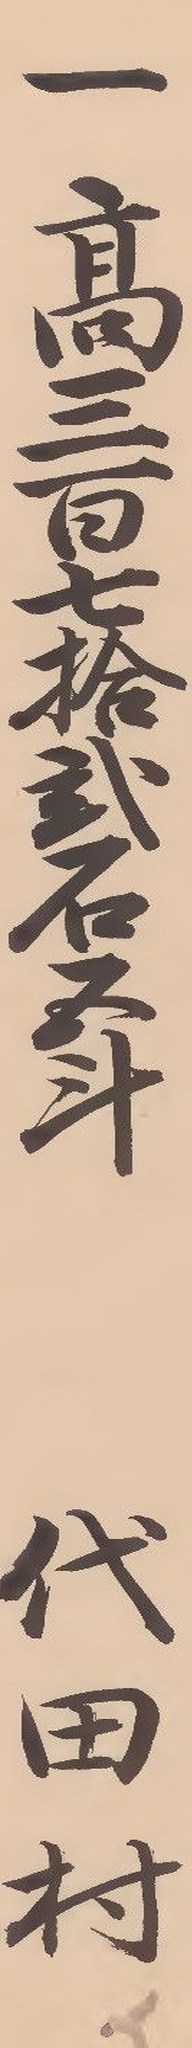一高三百七拾弐石五斗代田村
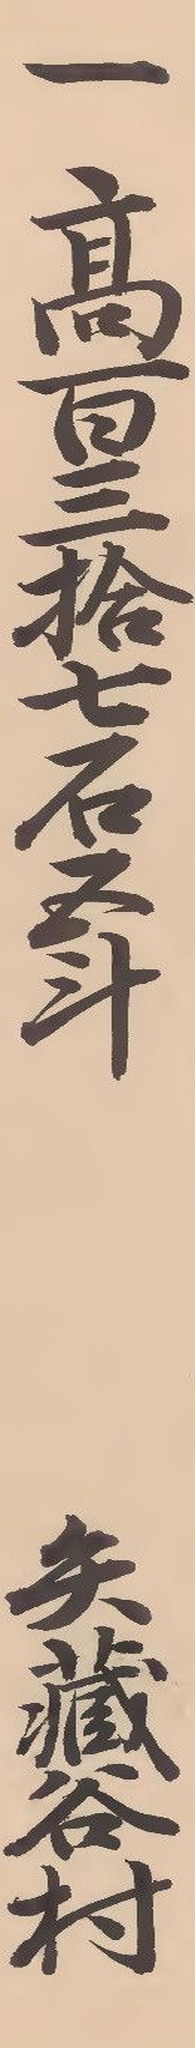一高百三拾七石五斗矢蔵谷村
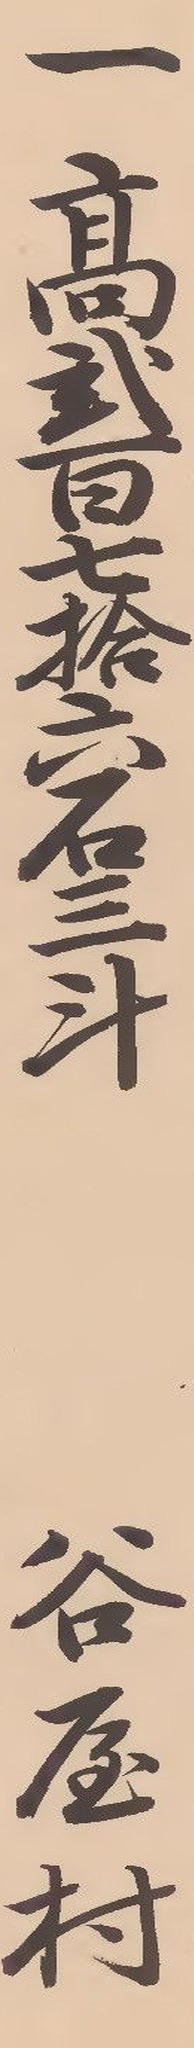一高弐百七拾六石三斗谷屋村
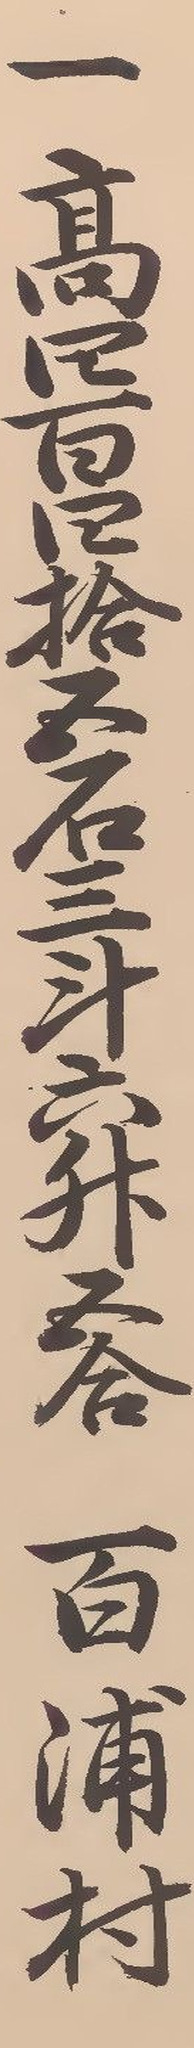一高四百四拾五石三斗六升五合百浦村
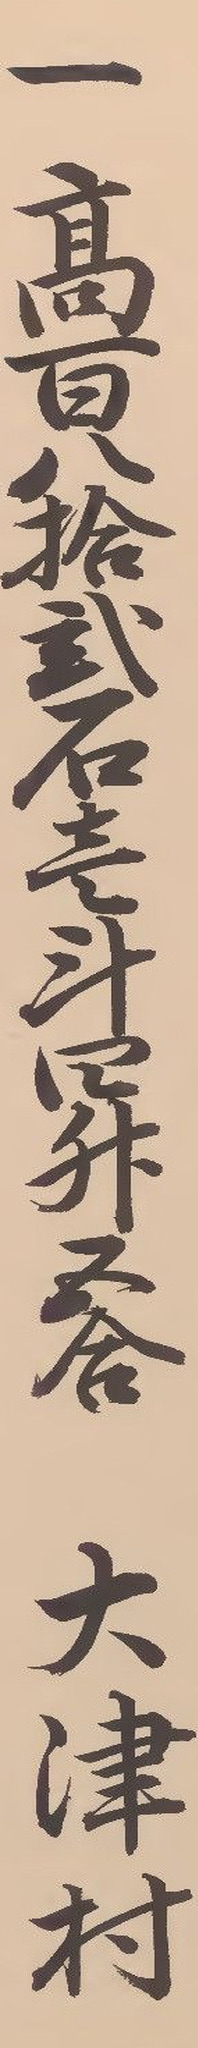一高百八拾弐石壱斗四升五合大津村
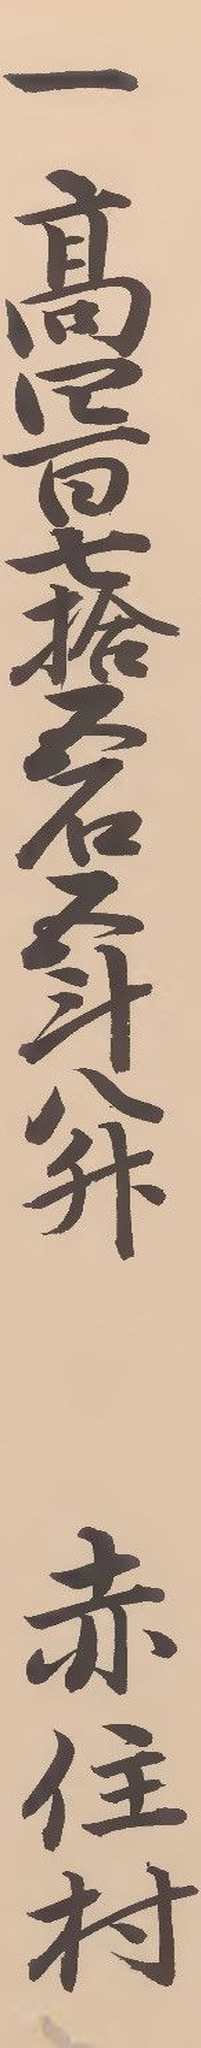一高四百七拾五石五斗八升赤住村
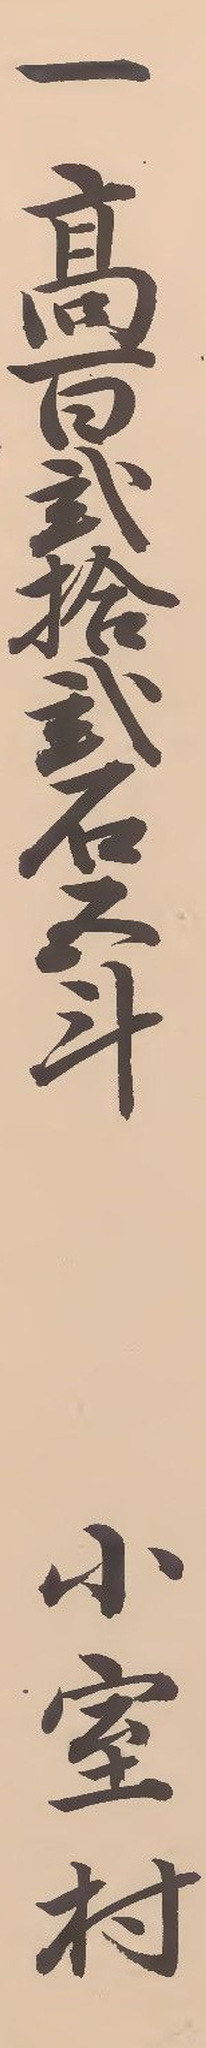一高百弐拾弐石五斗小室村

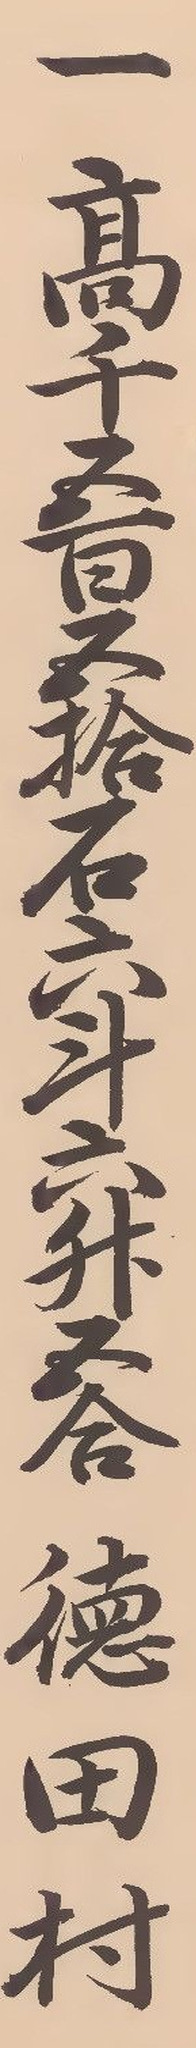一高千五百五拾石六斗六升五合徳田村
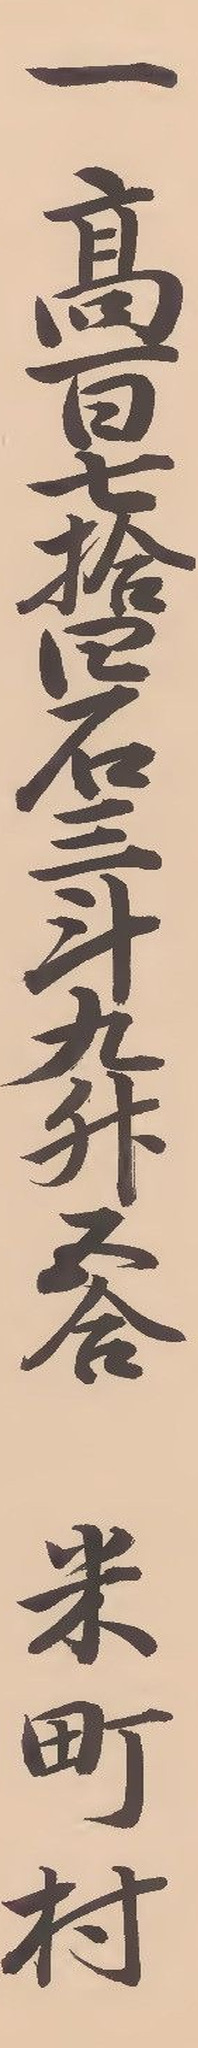一高百七拾四石三斗九升五合米町村
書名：能登国郷帳
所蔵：国立公文書館 National Archives of Japan
